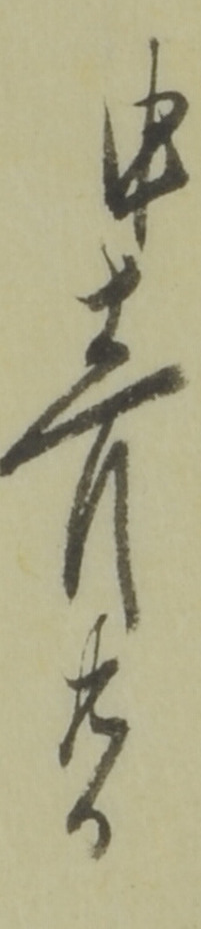申十二月廿日
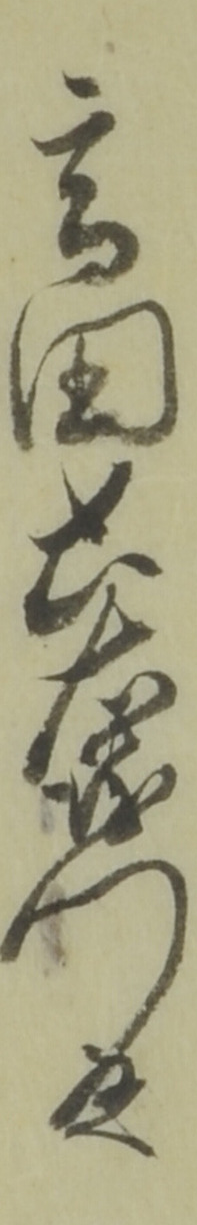高田六右衛門殿
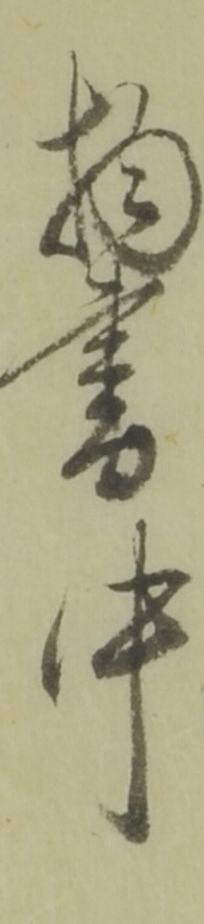物書中
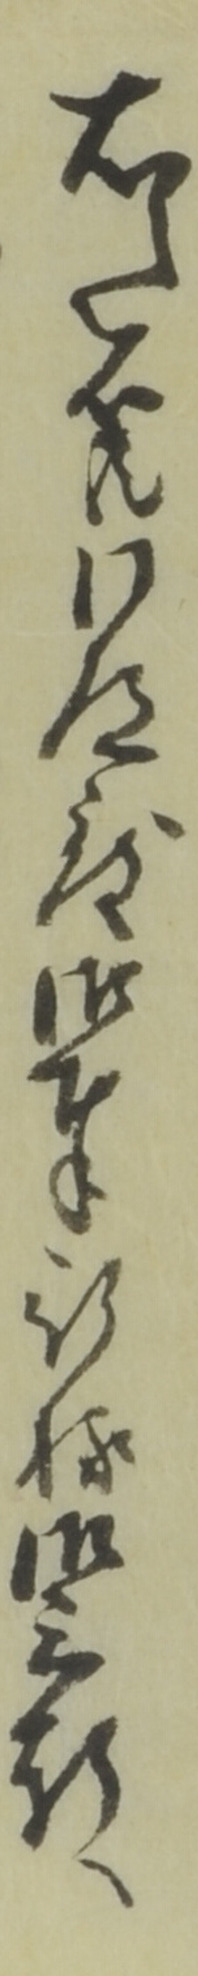右之者共同道致御奉行様御三軒へ
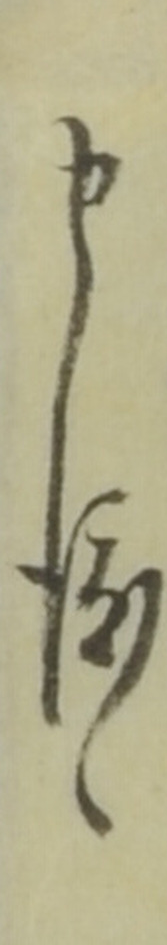申渡候
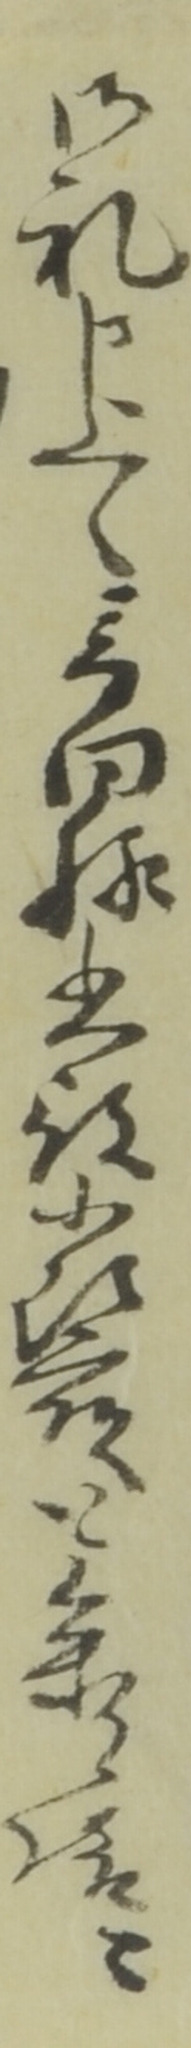御礼申上候高田様書役小頭衆へと参り候様ニ

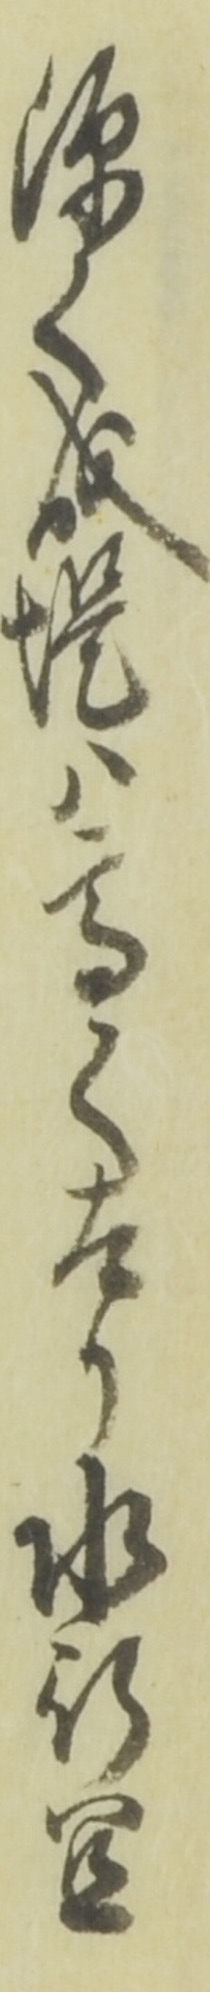深く成堤ハ高くなり水行宜
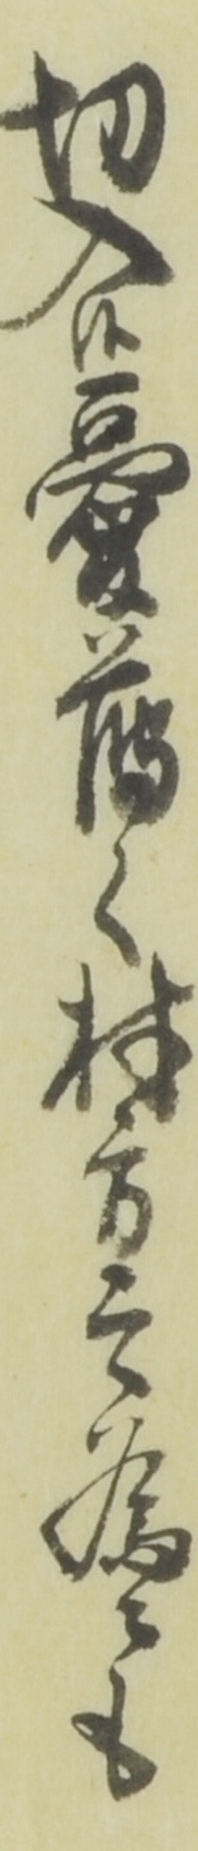切入候憂薄く村方之為ニも
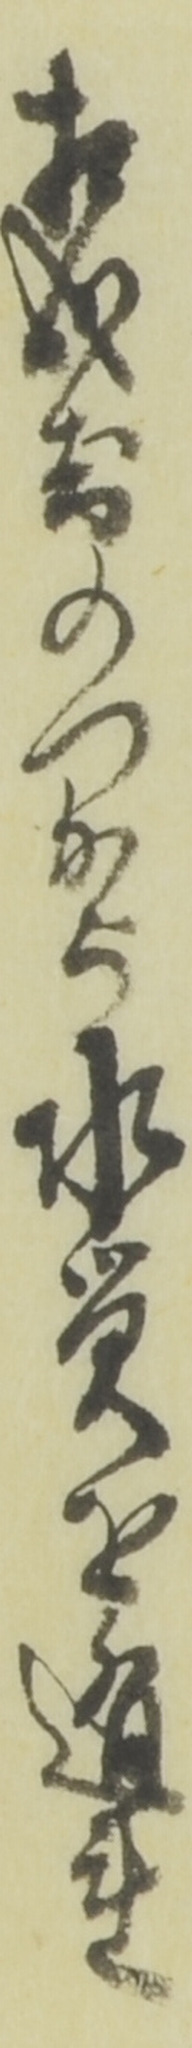相成おのつから水災を遁れ
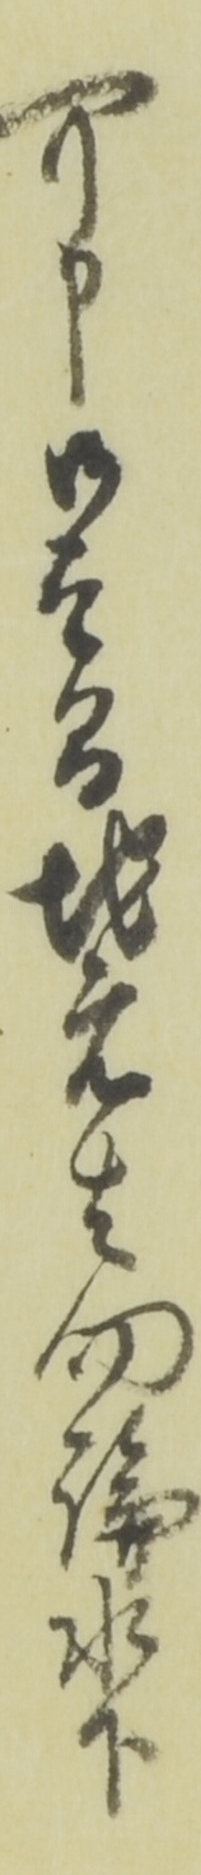可申候之間地元は勿論水下
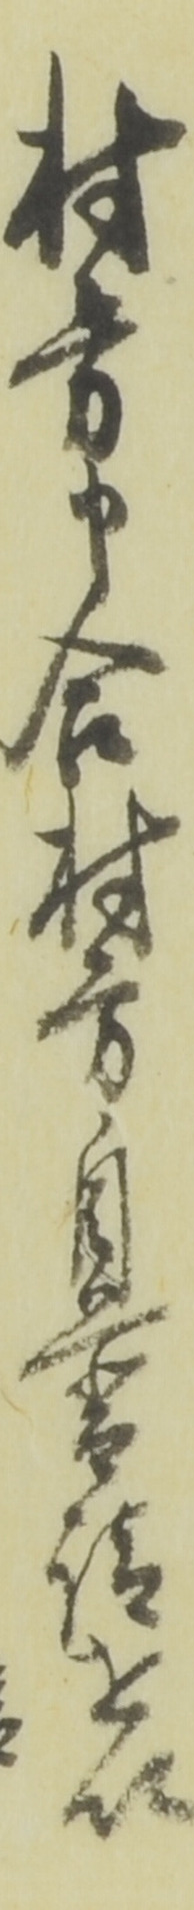村方申合村方自普請を以
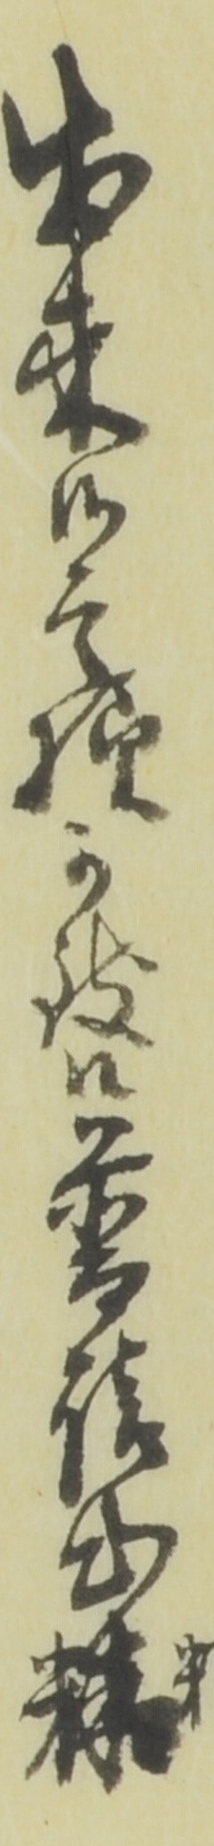出来候之様可致候普請出精
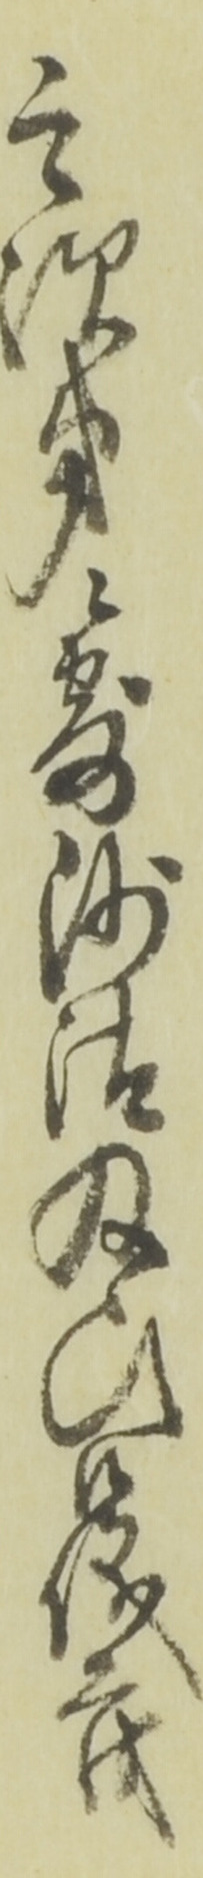之次第ニ寄沙汰及ひ候儀も
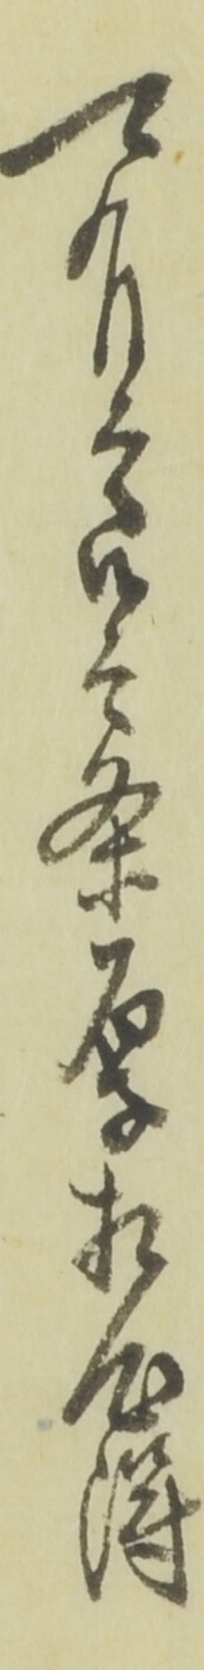可有之候之条厚相心得
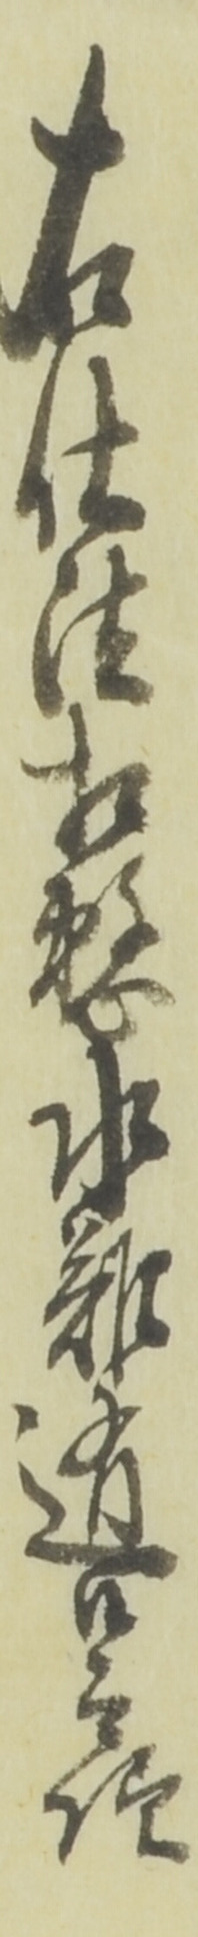右仕法相整水難遁候之様
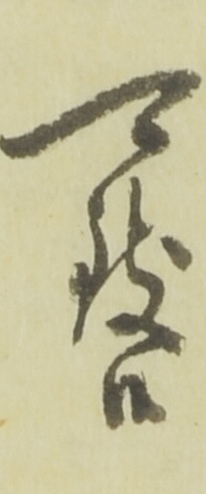可致候
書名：御触書御書附控
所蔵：伊那市立高遠町図書館・合同会社AMANE
